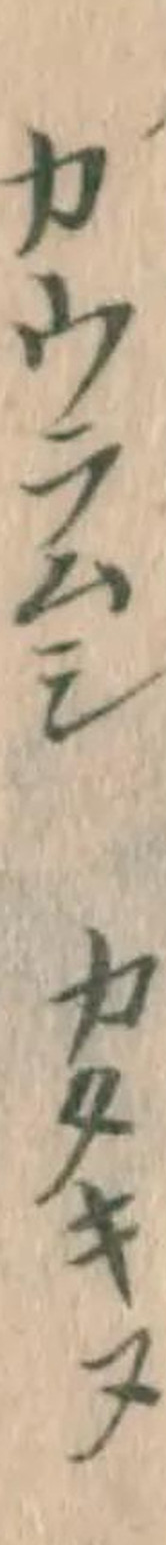カウラムシカタキヌ
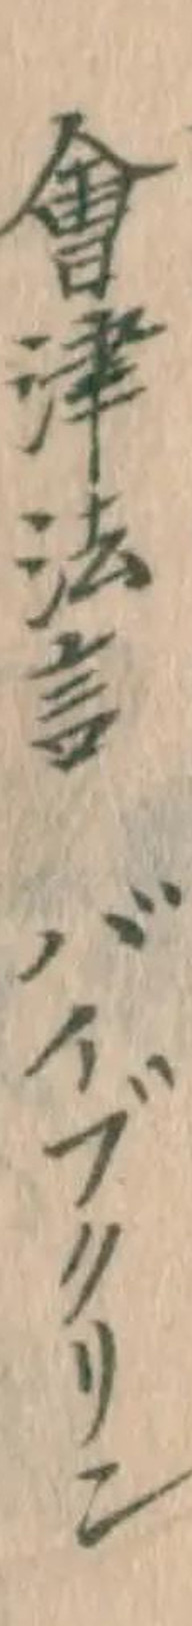會津法言バイブクリン
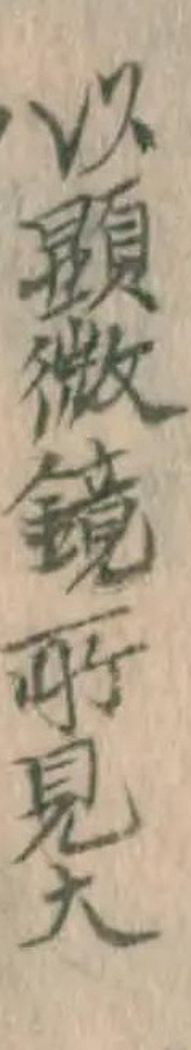以顕微鏡所見大
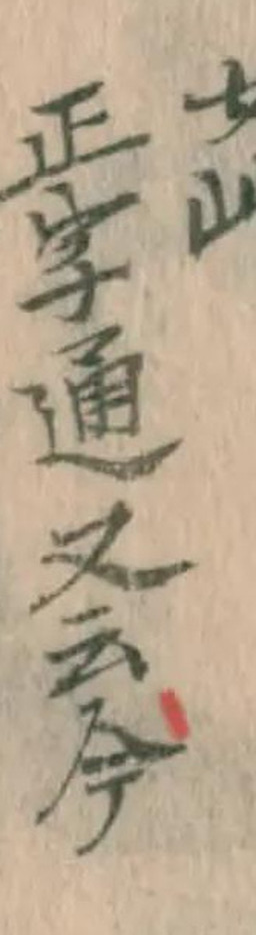正字通又云、今
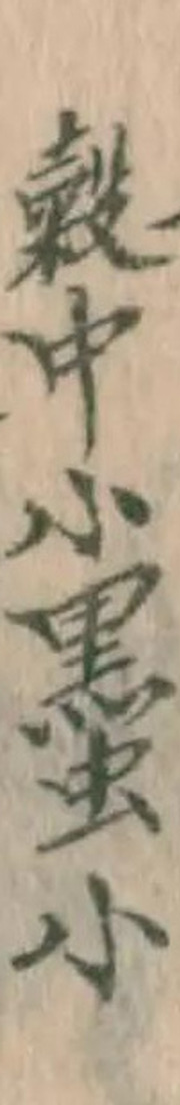穀中小黒虫小
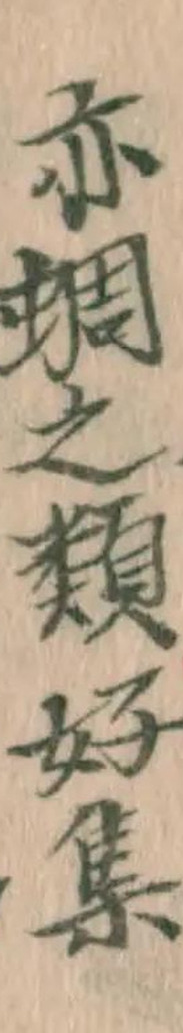亦蜩之類、好集
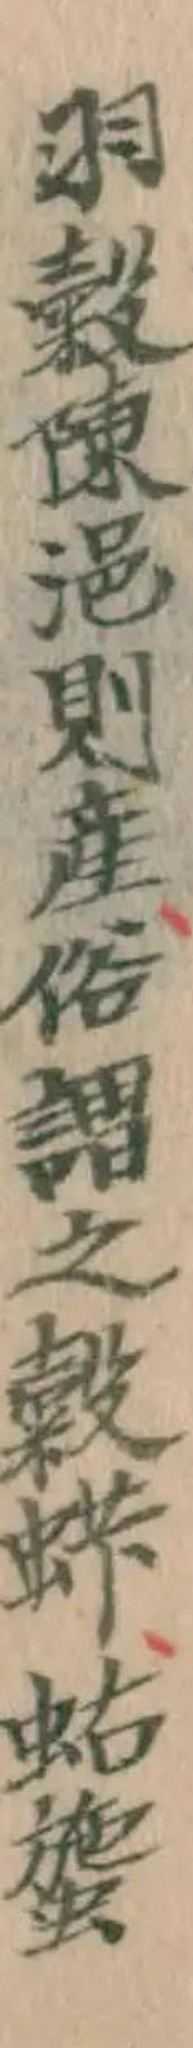羽穀陳浥則産、俗謂之穀蝆、蛄䗐
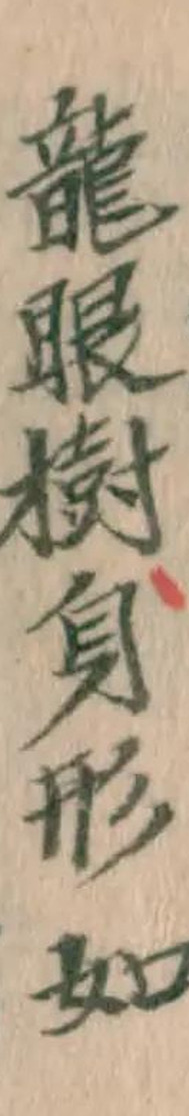龍眼樹、身形如
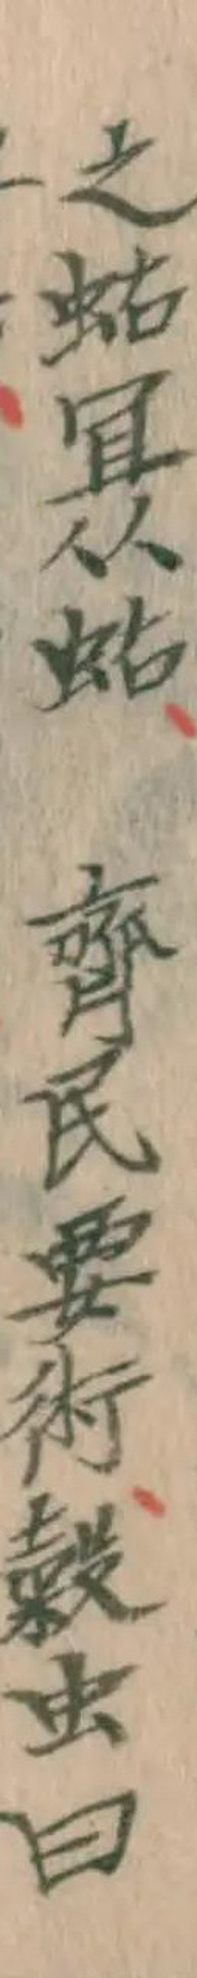之蛄冝从蛄、齊民要術、穀虫曰
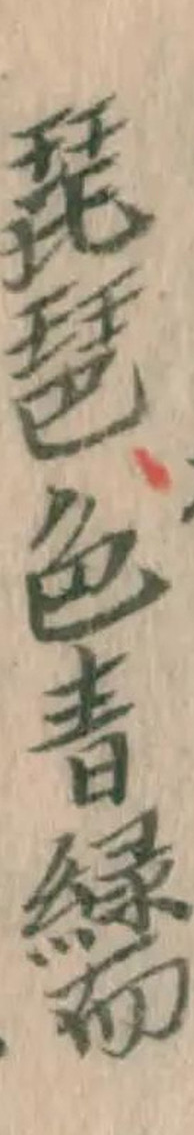琵琶、色青緑而
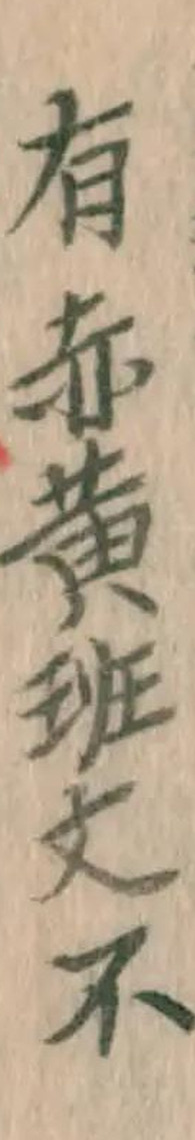有赤黄班文不
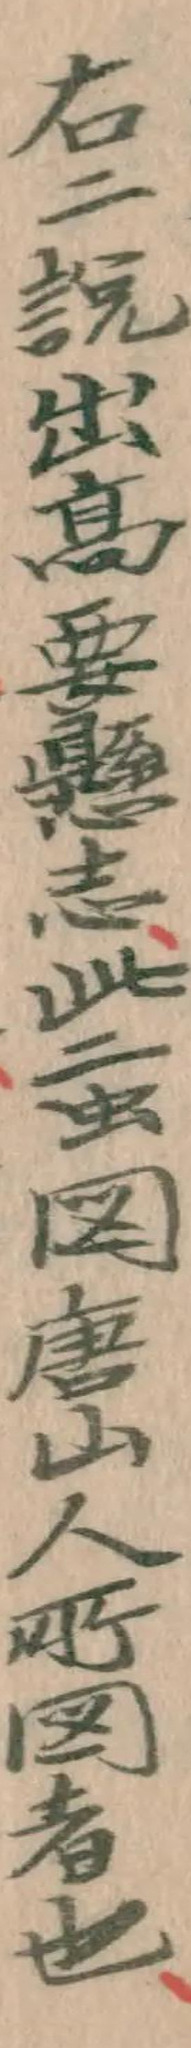右二説出高要懸志、此二虫図唐山人所図者也、
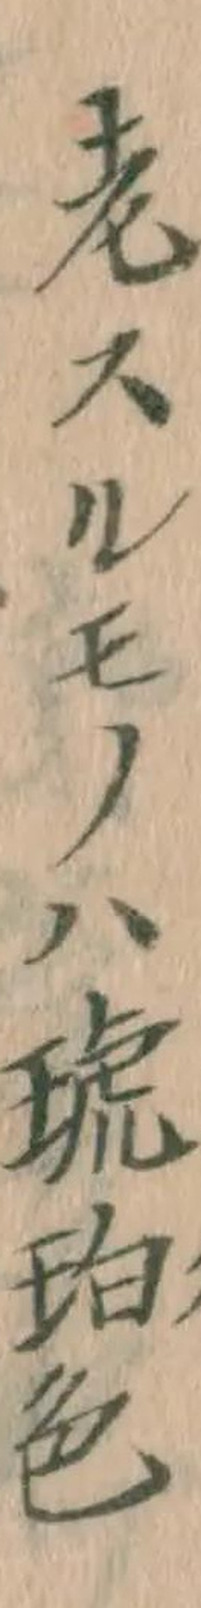老スルモノハ琥珀色
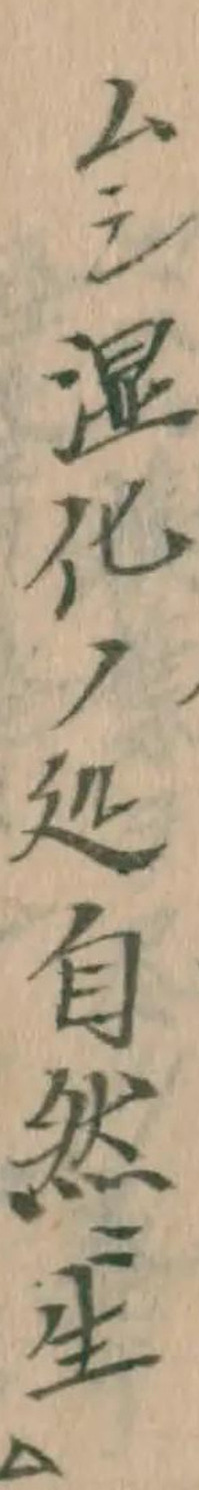ムシ湿化ノ処自然ニ生△
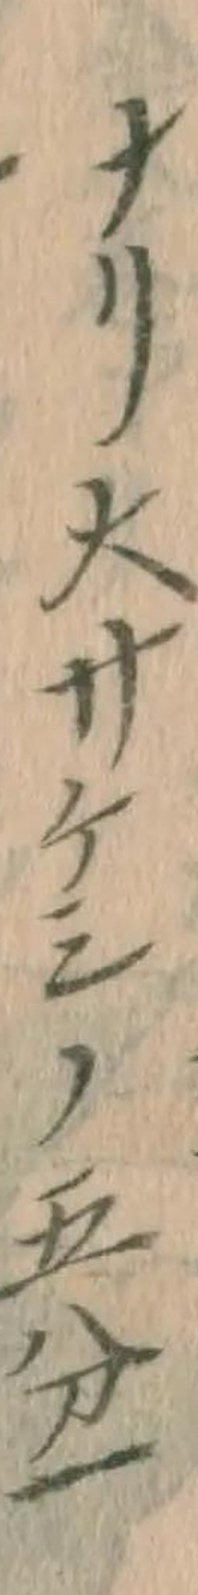ナリ大サケシノ五分一
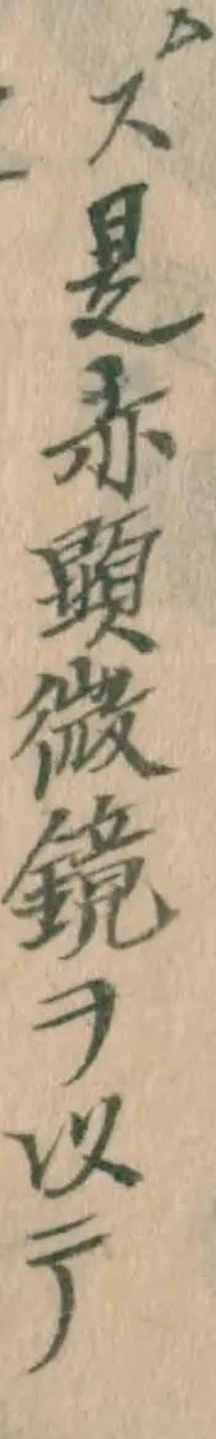△ス是亦顕微鏡ヲ以テ
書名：千蟲譜 3巻. [1]
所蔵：国立国会図書館 National Diet Library, JAPAN
